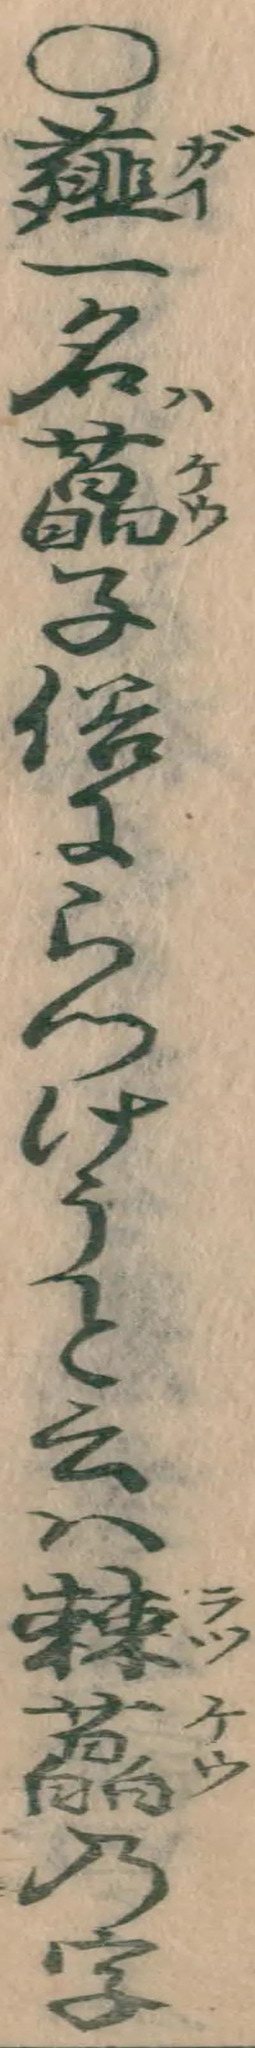〇薤一名藠子俗にらつけうと云は辣藠の字
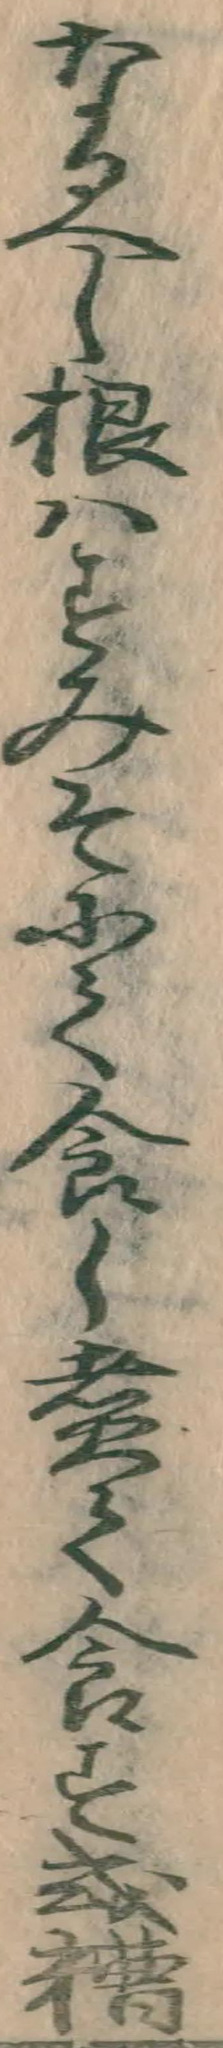なるへし根はすみそにて食し煮て食す或糟
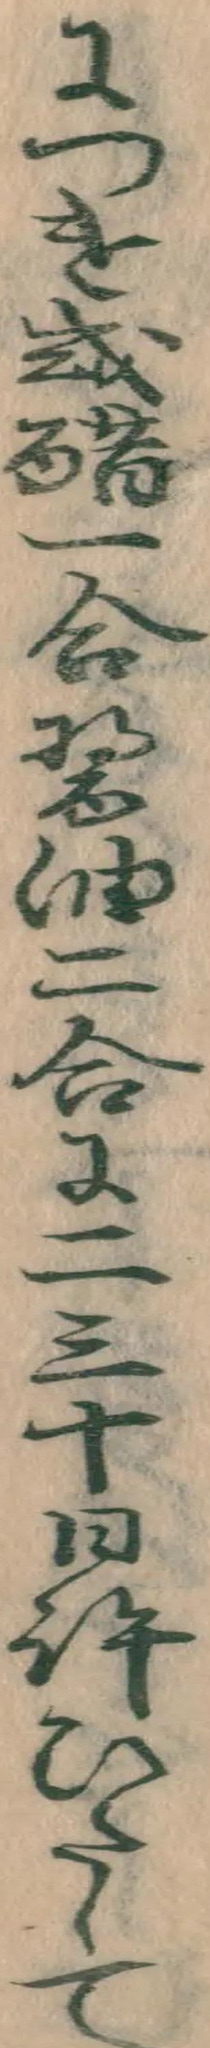につけ或醋一合醤油二合に二三十日許ひたして
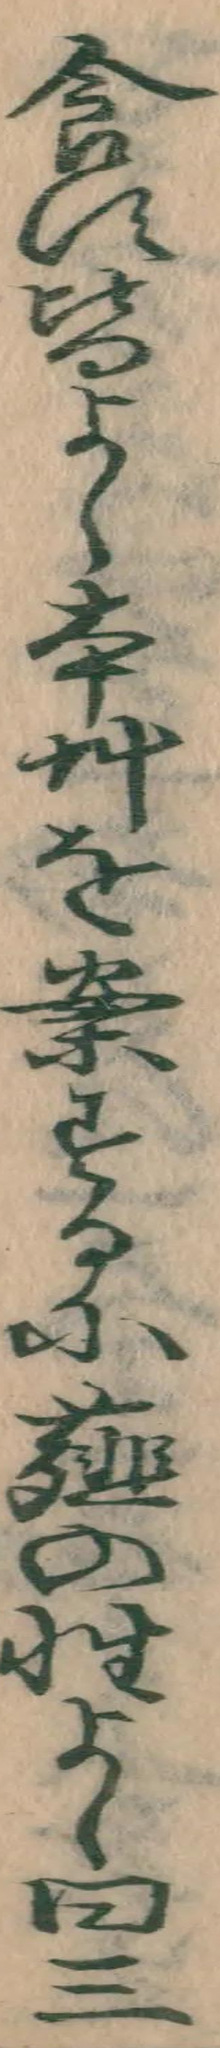食す皆よし本艸を案するに薤の性よし曰三
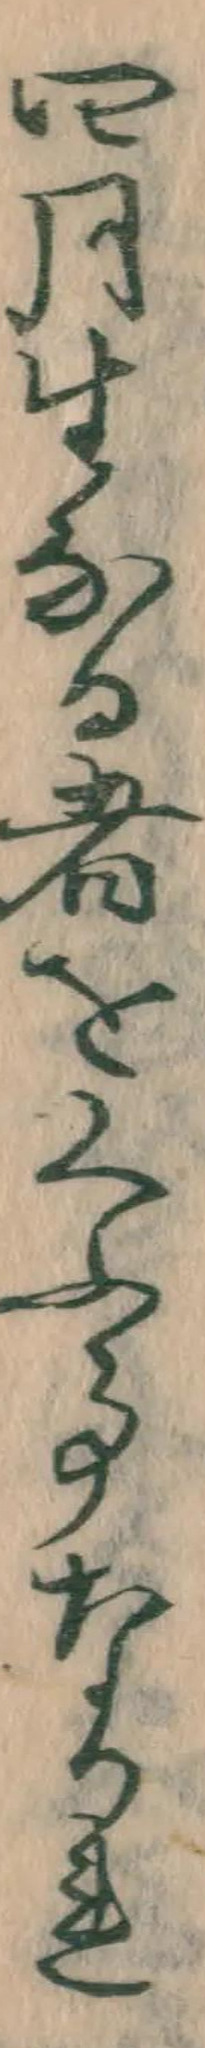四月生なる者をくふ事なかれ
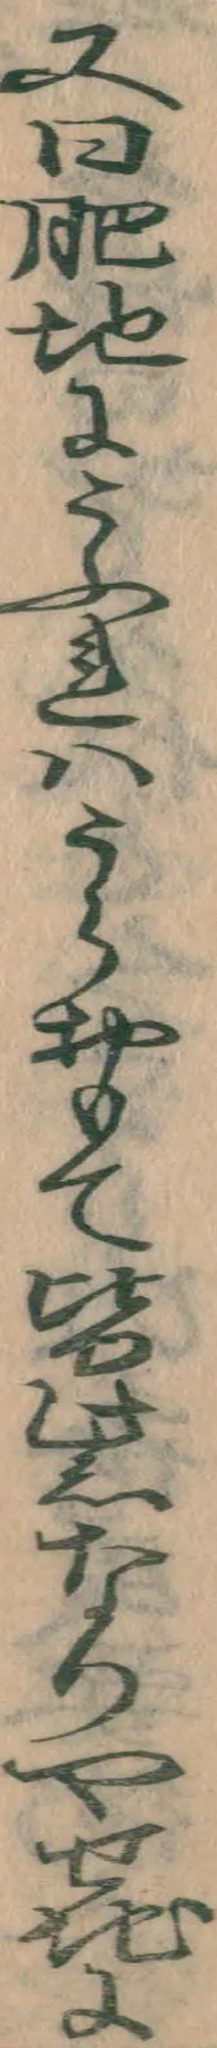又曰肥地にうふれはうらおもて皆紫なりやせ地に
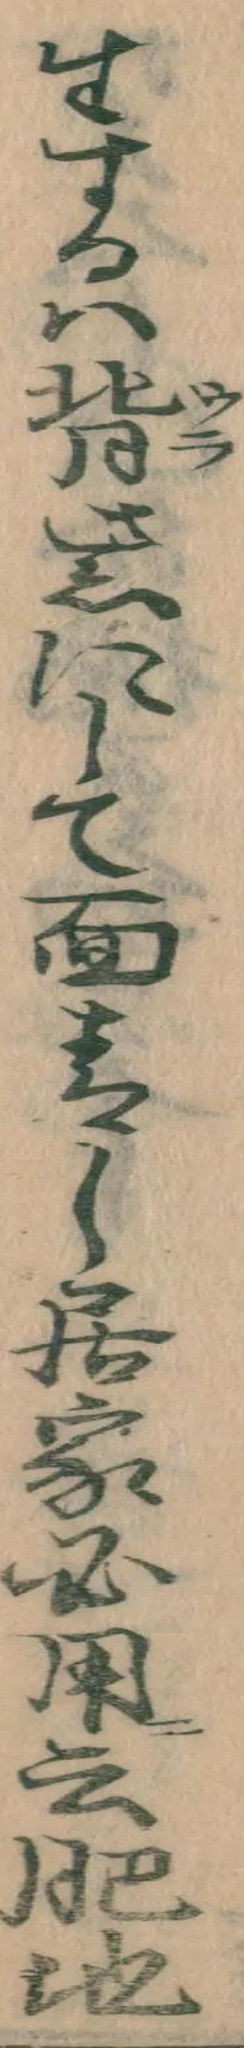生するは背紫にして面青し居家必用云肥地
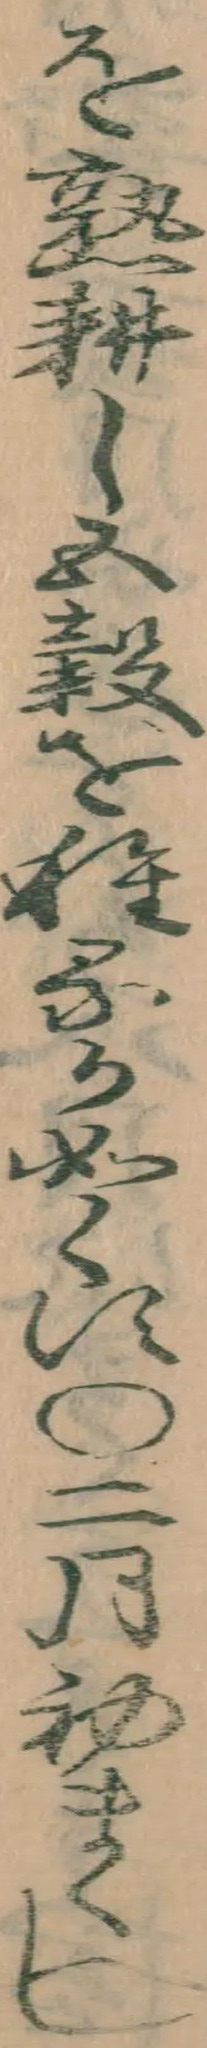を熟耕し五穀を種るか如くす〇二月初まくへし
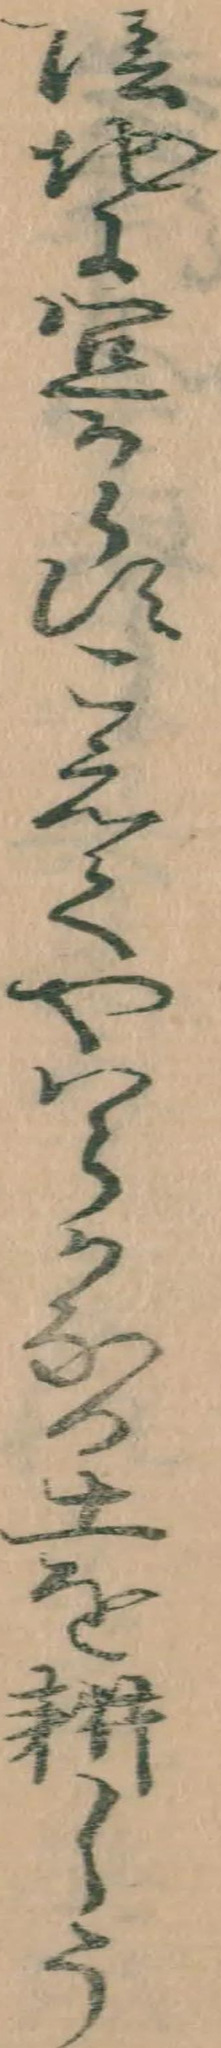陰地に宜からすこえてやはらかなる土を耕しう
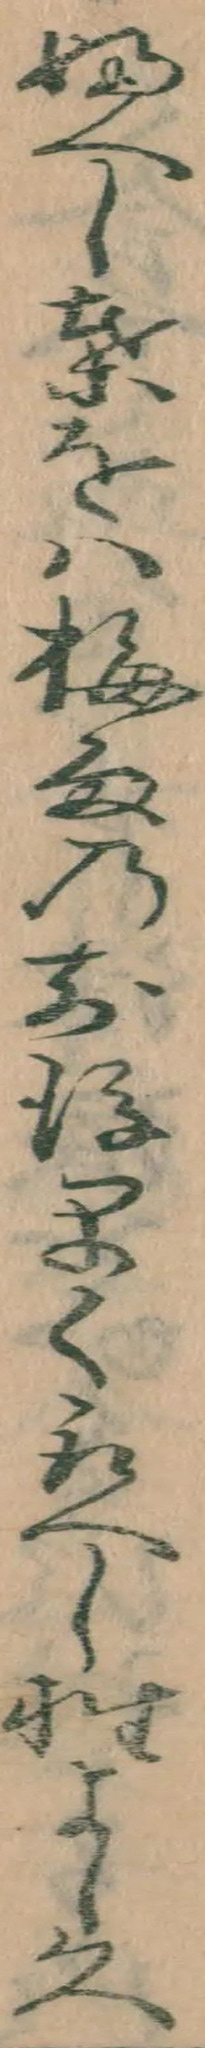ふへし葉をは梅雨の前後早く取へし性よし久
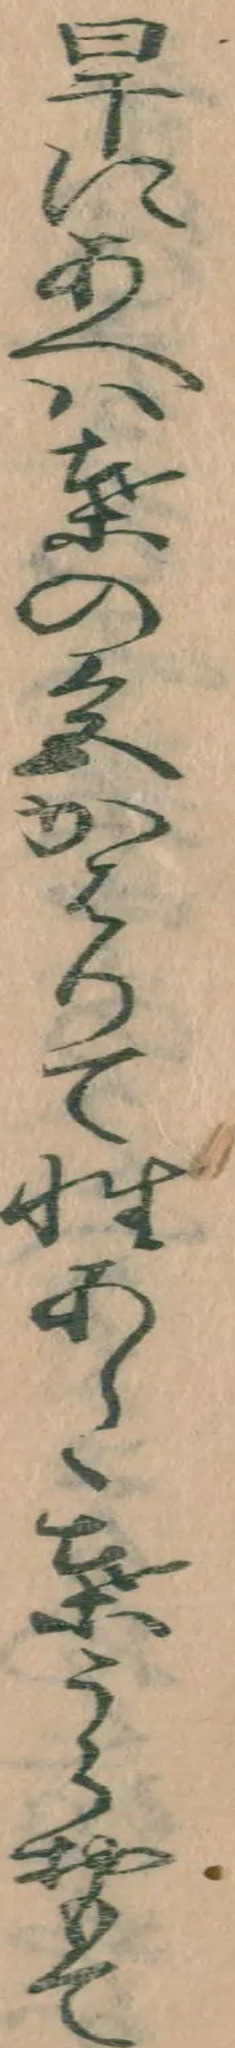旱にあへは葉の色かはりて性あしく葉うらおもて
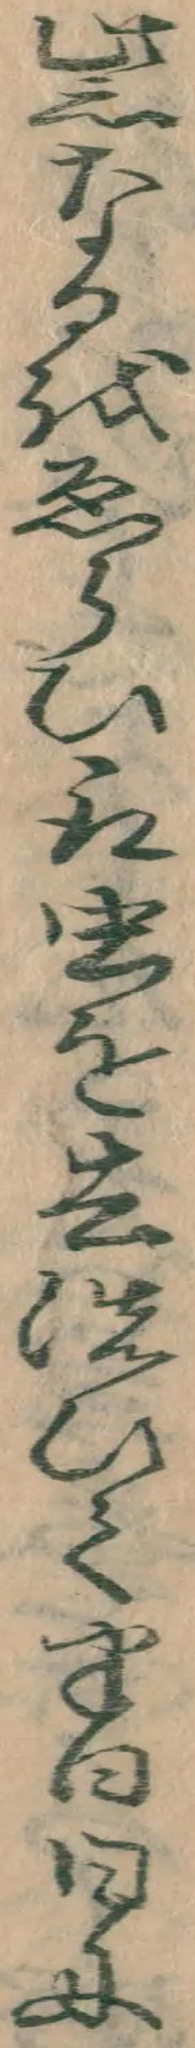紫なるをゑらひ取虫を去洗ひて半日日に
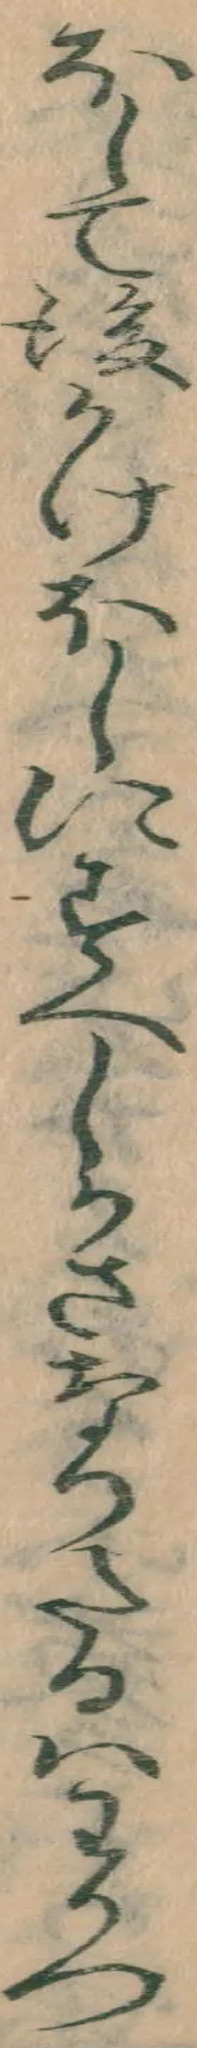ほして後かけほしにすへしかさなりたるはわかつ
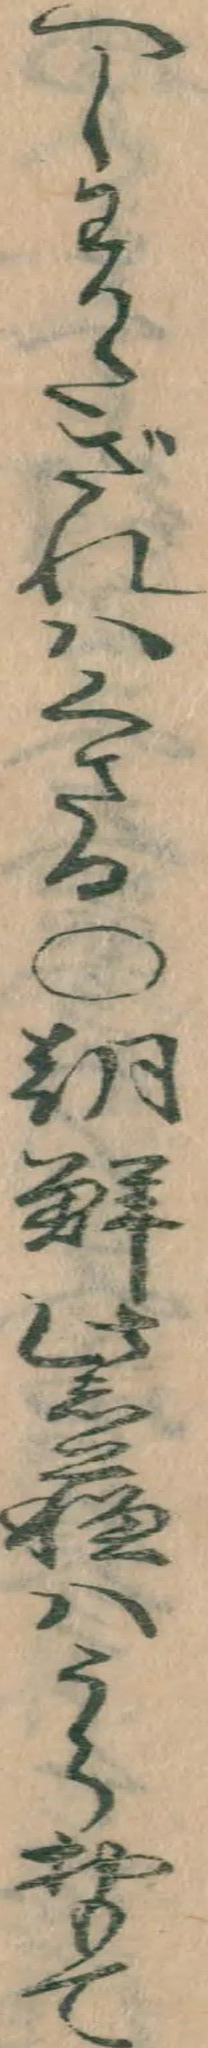へしわかたざれはくさる〇朝鮮紫蘇はうらおもて
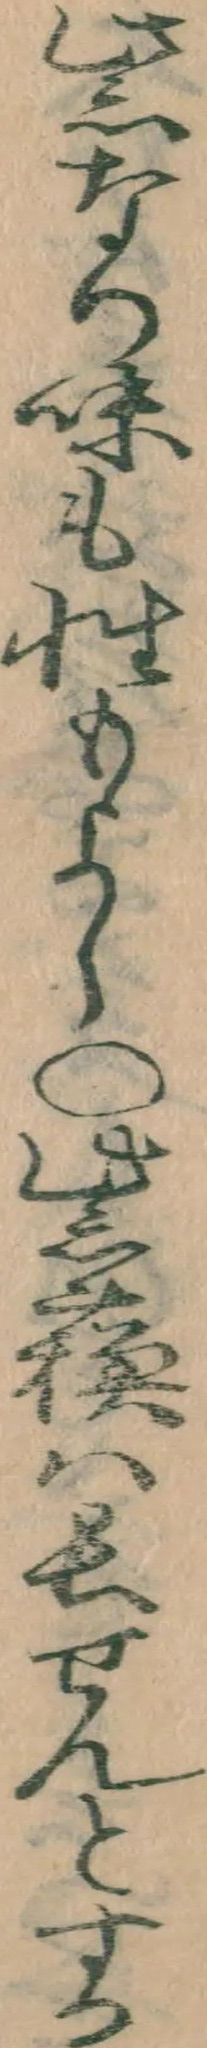紫なり味も性もよし〇紫蘇は長せんとする
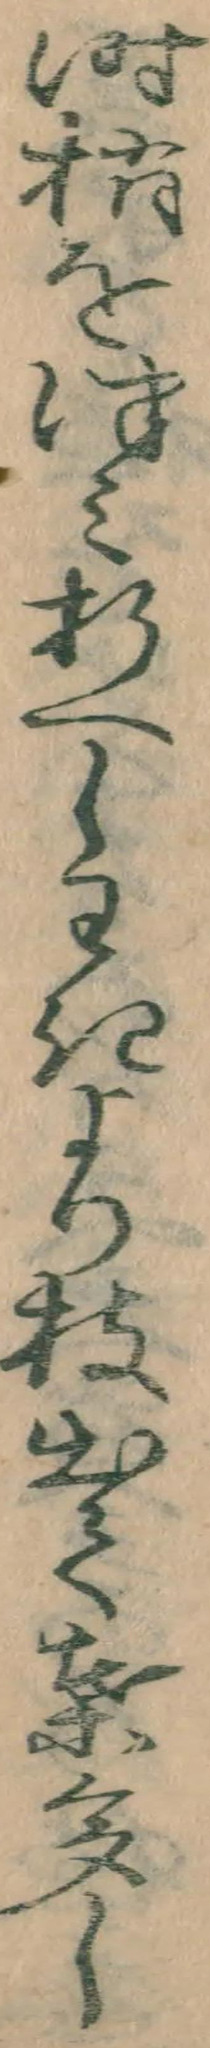時梢をつみ折へしわきより枝出て葉多し
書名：菜譜 3巻
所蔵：国立国会図書館 National Diet Library, JAPAN
